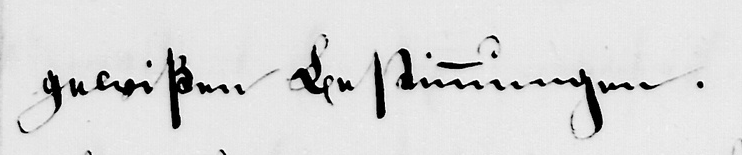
gewißen Bestimmungen.
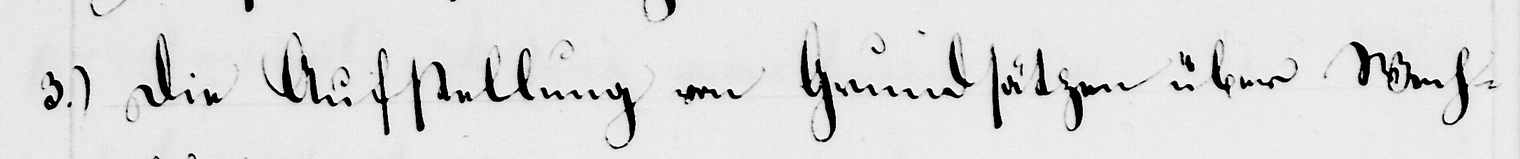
3.) Die Aufstellung von Grundsätzen über Wech¬
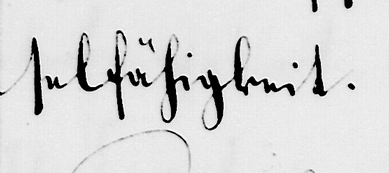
selfähigkeit.
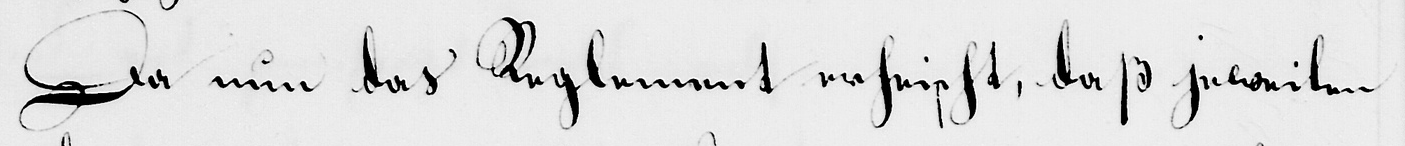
Da nun das Reglement erheischt, daß jeweilen
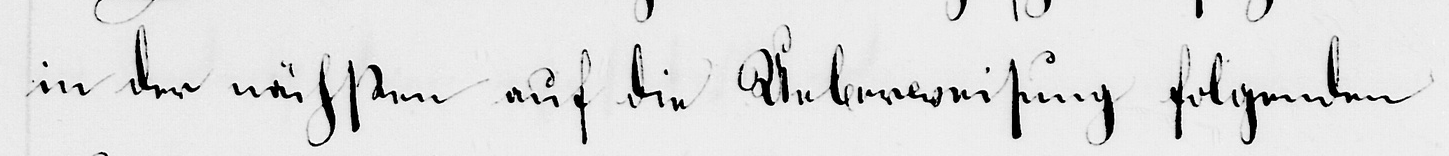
in der nächsten auf die Ueberweisung folgenden
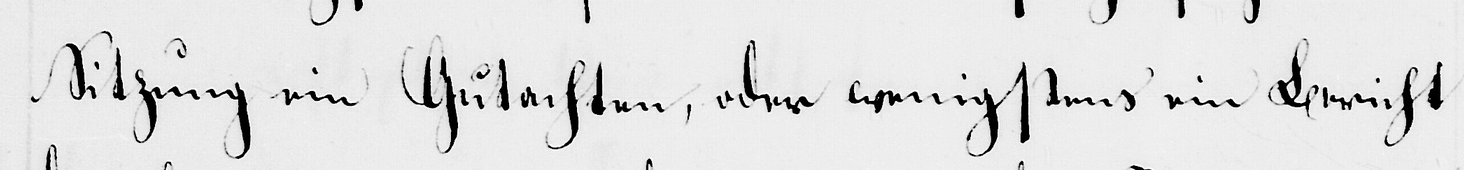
Sitzung ein Gutachten, oder wenigstens ein Bericht
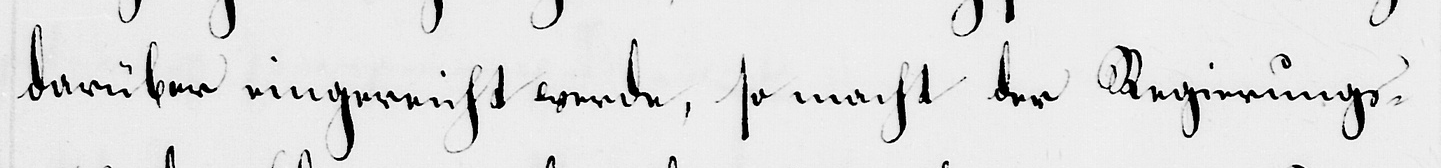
darüber eingereicht werde, so macht der Regierungs¬
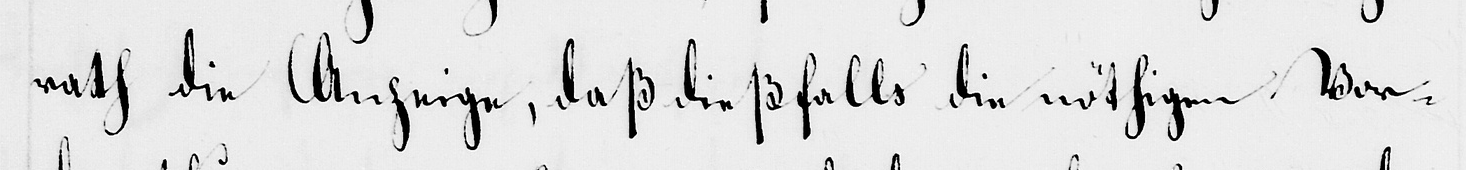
rath die Anzeige, daß dießfalls die nöthigen Vor¬
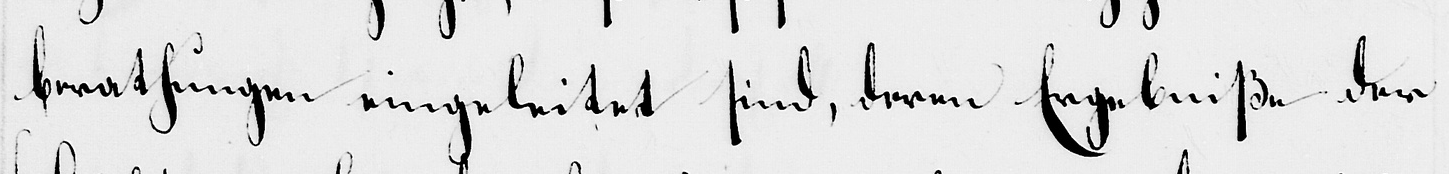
berathungen eingeleitet sind, deren Ergebniße der
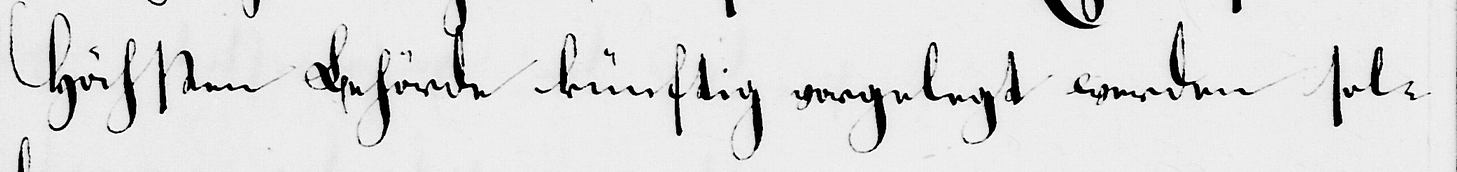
Höchsten Behörde künftig vorgelegt werden sol¬
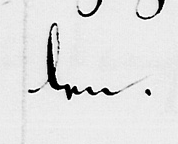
len.
